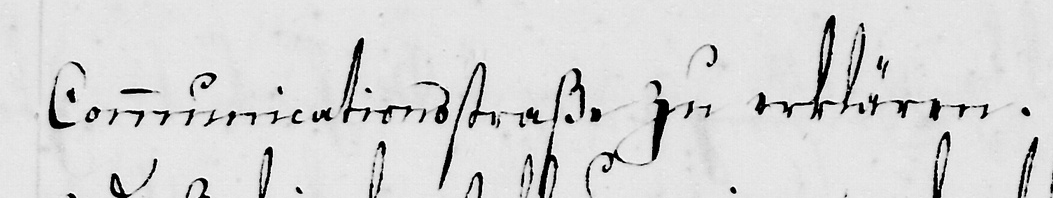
Communicationsstraße zu erklären.
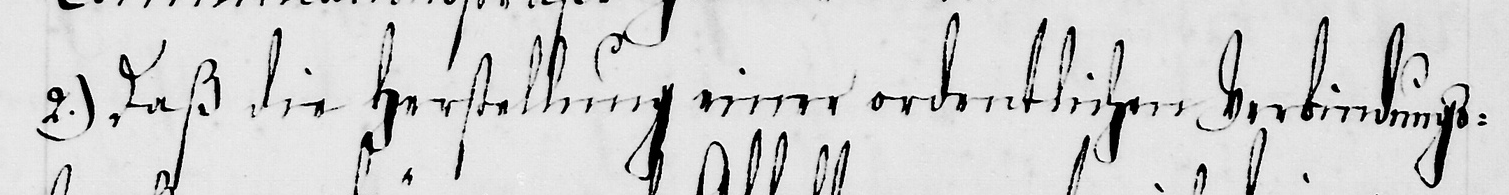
2.) Daß die Herstellung einer ordentlichen Verbindungs¬
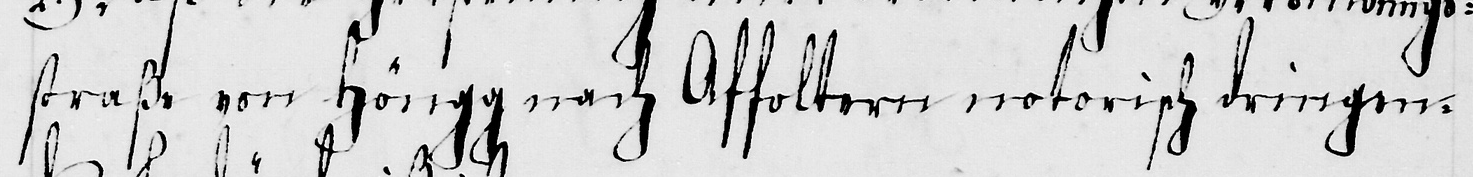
straße von Höngg nach Affoltern notorisch dringen¬
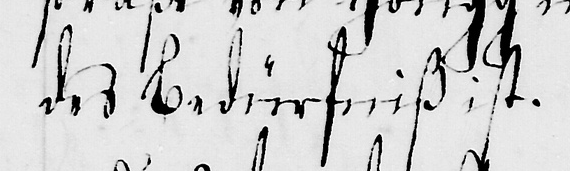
des Bedürfniß ist.
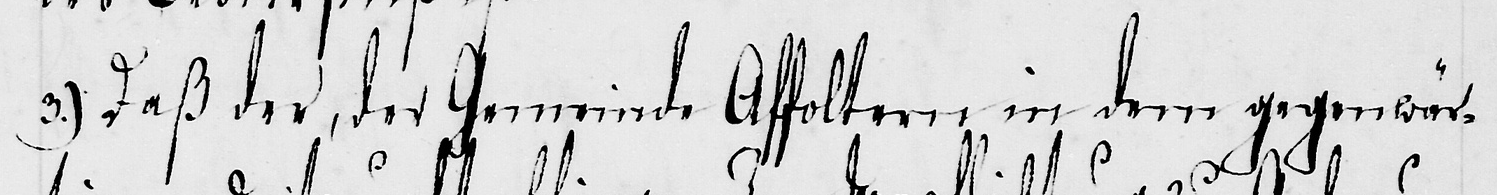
3.) Daß der, der Gemeinde Affoltern in dem gegenwär¬
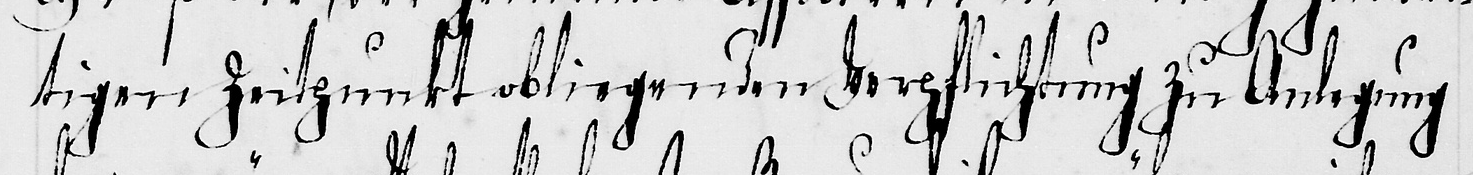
tigen Zeitpunkt obliegenden Verpflichtung zu Anlegung
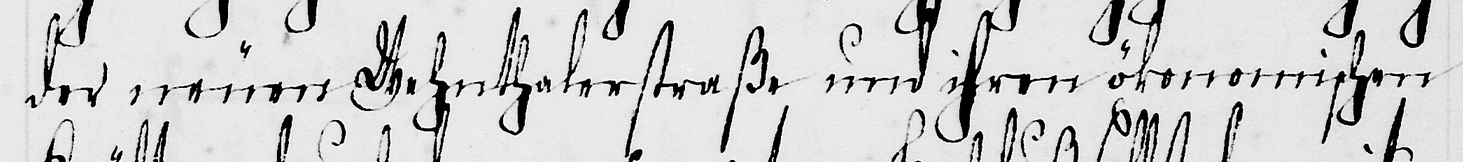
der neuen Wehnthalerstraße und ihren ökonomischen
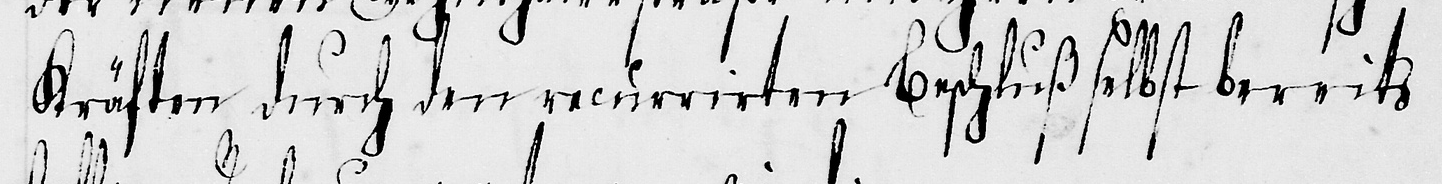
Kräften durch den recurrirten Beschluß selbst bereits
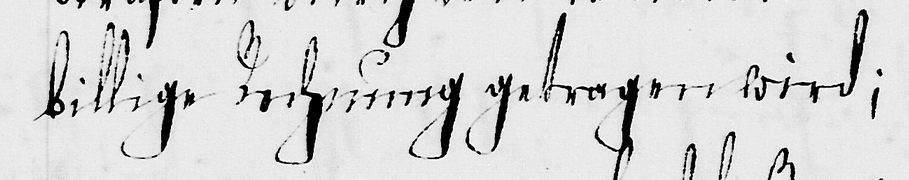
billige Rechnung getragen wird;
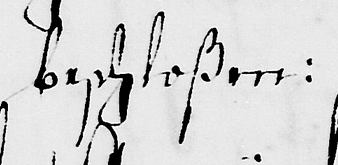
beschloßen:
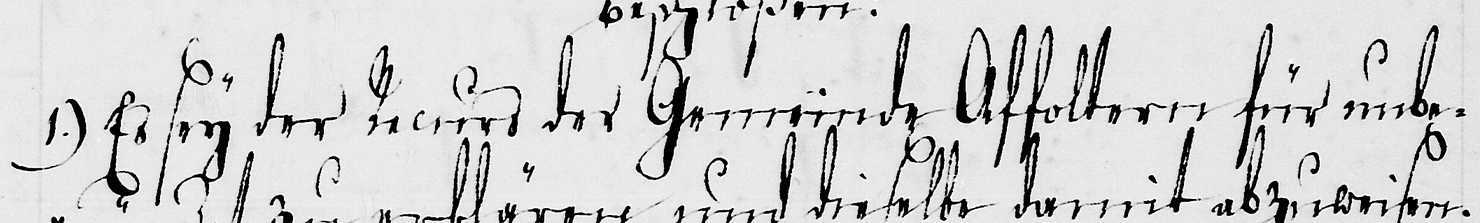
Es sey der Recurs der Gemeinde Affoltern für unbe¬
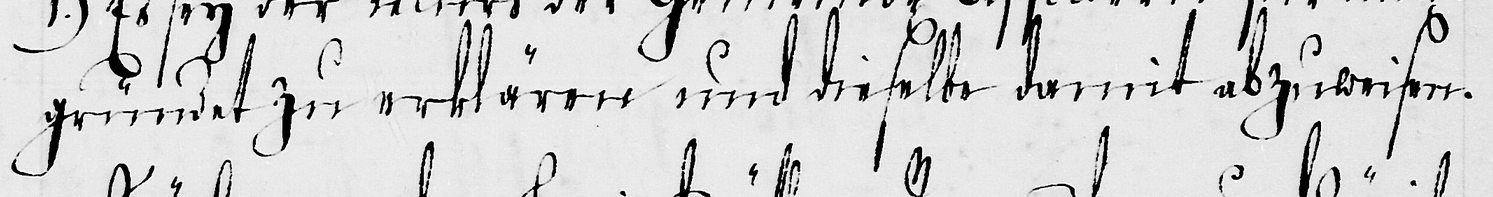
gründet zu erklären und dieselbe damit abzuweisen.
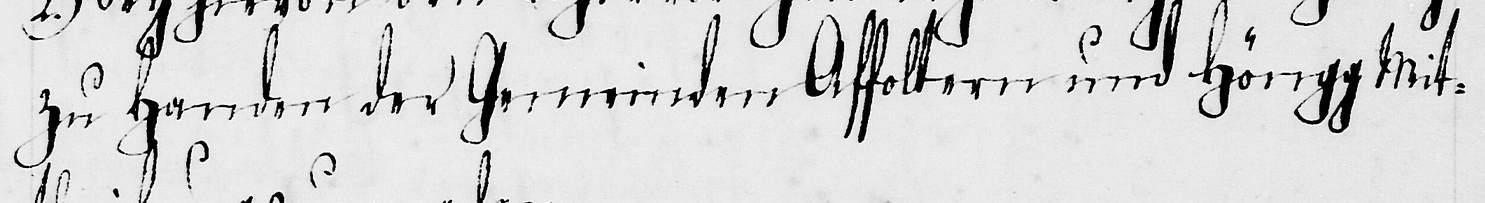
zu Handen der Gemeinden Affoltern und Höngg Mit¬
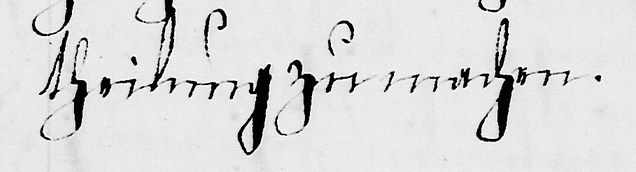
theilung zu machen.
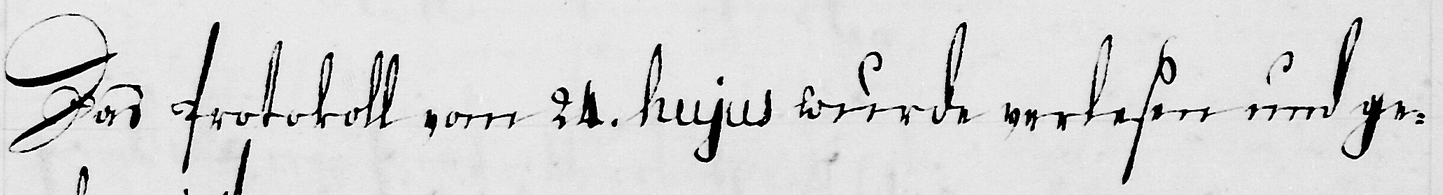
Das Protokoll vom 24. hujus wurde verlesen und ge¬
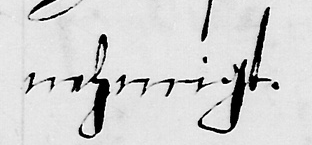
nehmigt.
